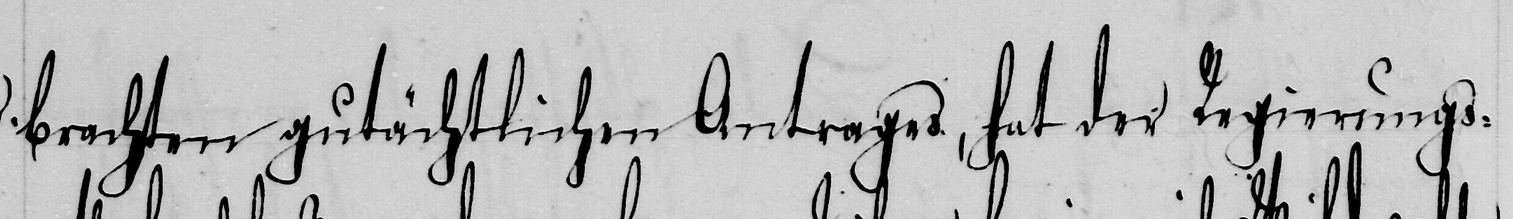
brachten gutächtlichen Antrages, hat der Regierungs¬
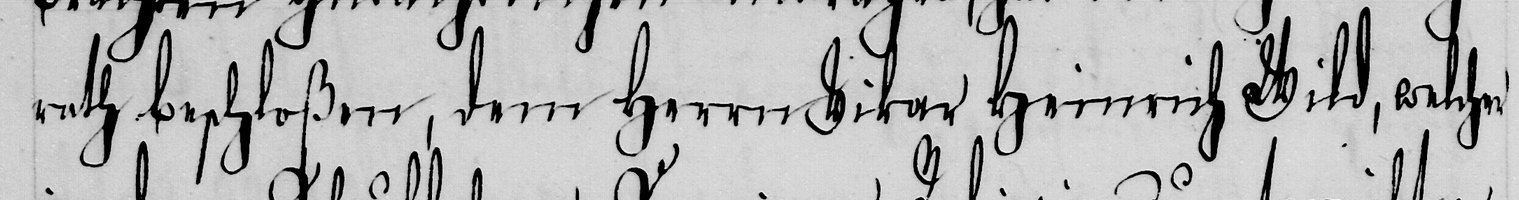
rath beschloßen, dem Herrn Vikar Heinrich Wild, welch¬
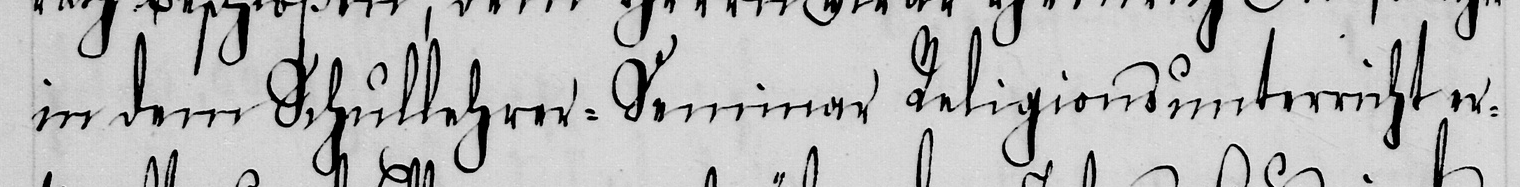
in dem Schullehrer-Seminar Religionsunterricht er¬
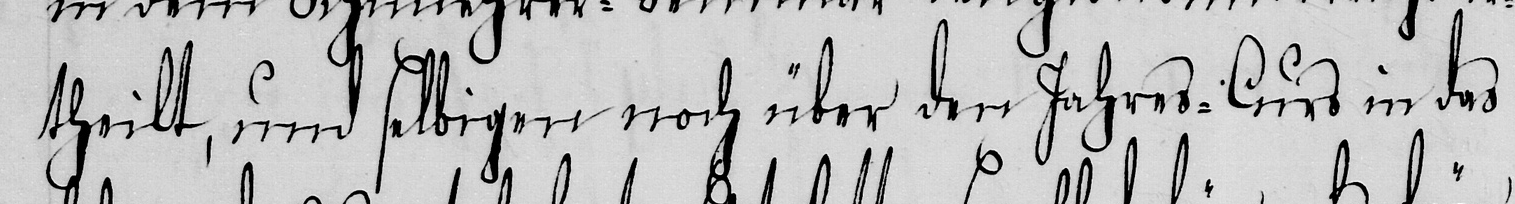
theilt, und selbigen noch über den Jahres-Curs in das
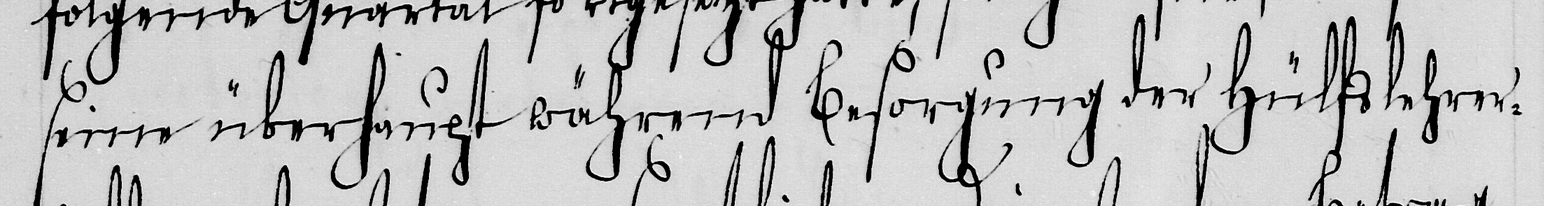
seine überhaupt während Besorgung der Hülfslehrer¬
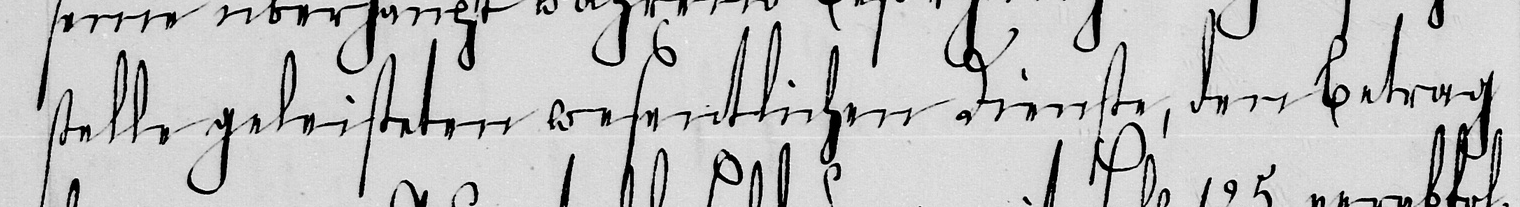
stelle geleisteten wesentlichen Dienste, den Betrag
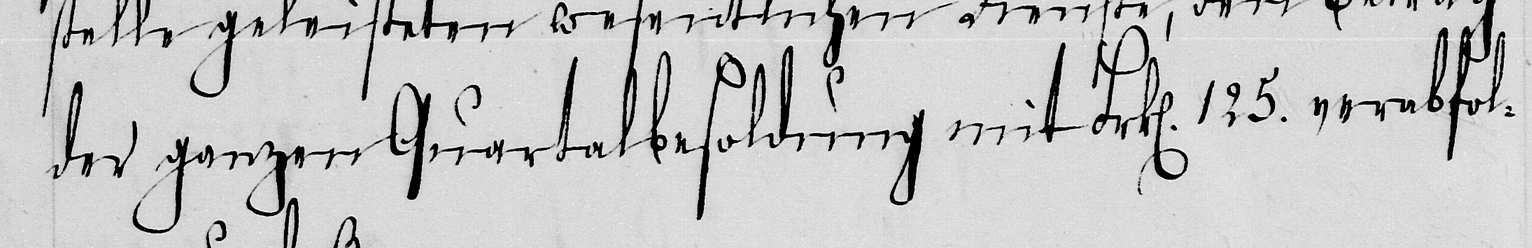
der ganzen Quartalbesoldung mit Frk[en]. 125. ve¬
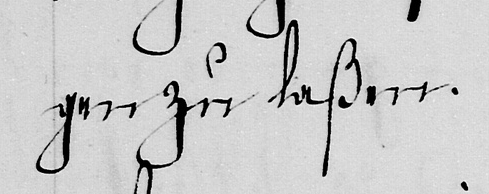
gen zu laßen.
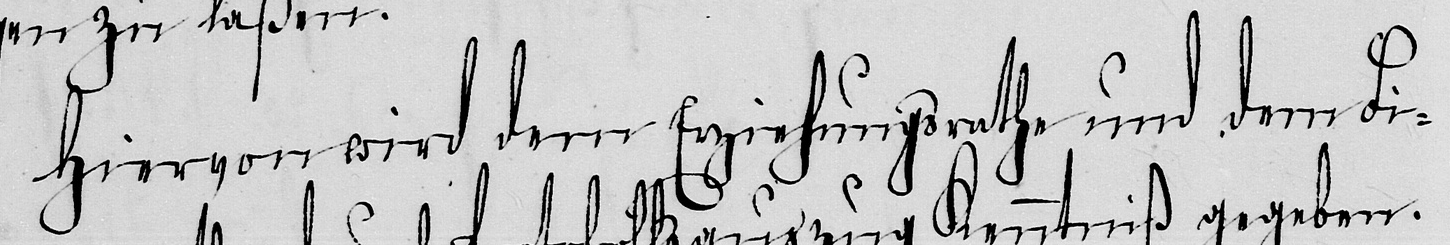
Hiervon wird dem Erziehungsrathe und dem Fi¬
